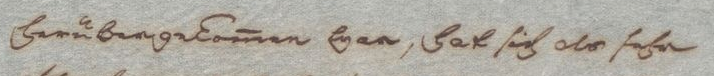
herübergekommen war, hat sich als sehr
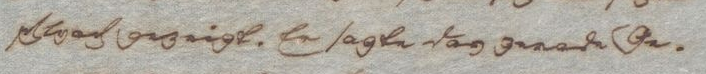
schwach gezeigt. Er sagte das genaue Ge-
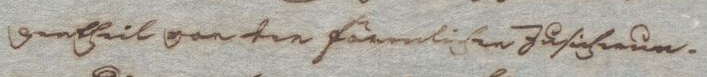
gentheil von den förmlichen Zusicherun-
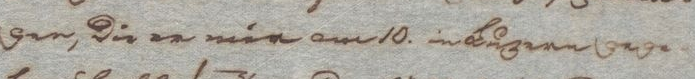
gen, die er mir am 10. in Luzern gege-
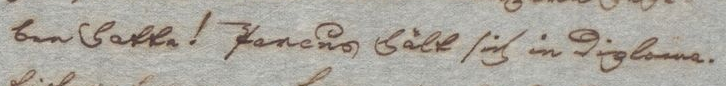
ben hatte! Parcus hält sich in diploma-
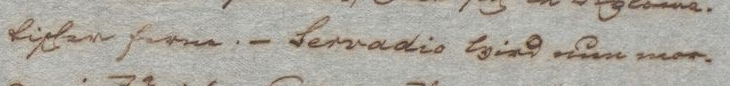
tischer Ferne. – Servadio wird nun mor-
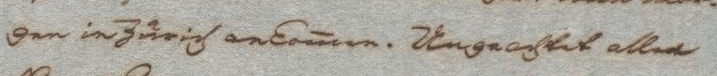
gen in Zürich ankommen. Ungeachtet aller
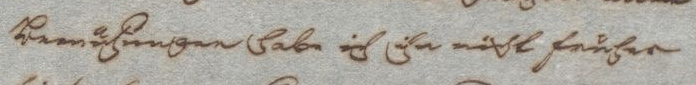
Bemühungen habe ich ihn nicht früher
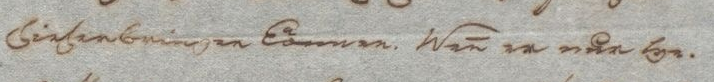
hieher bringen können. Wenn er nur we-
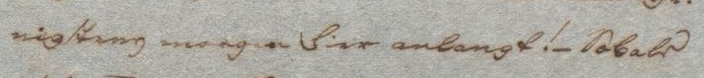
nigstens morgen hier anlangt! – Sobald
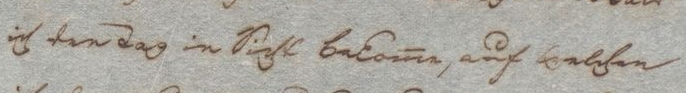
ich den Tag in Sicht bekomme, auf welchen
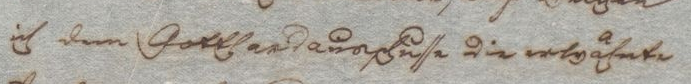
ich dem Gotthardausschusse die erwähnte
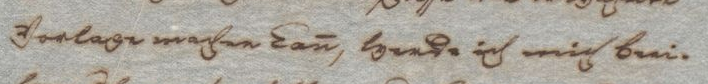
Vorlage machen kann, werde ich mich beei-
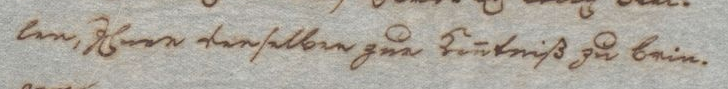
len, Ihnen denselben zur Kenntniß zu brin-
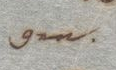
gen.
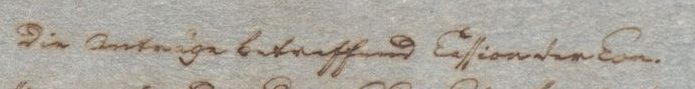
Die Anträge betreffend Cession der Con-
